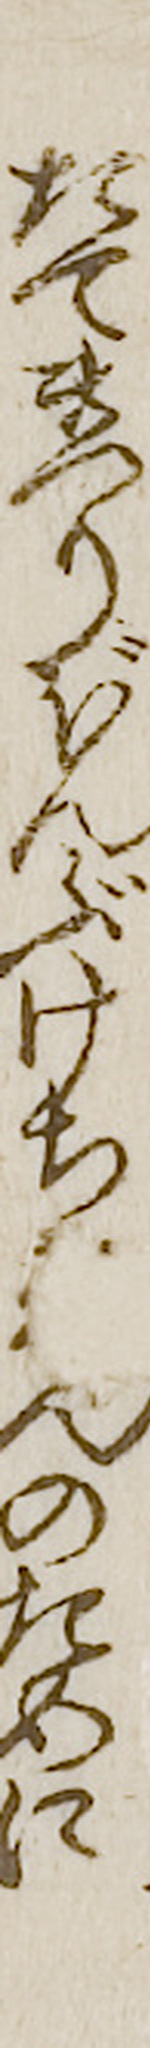たてまつりぼんぶけちゑんのために
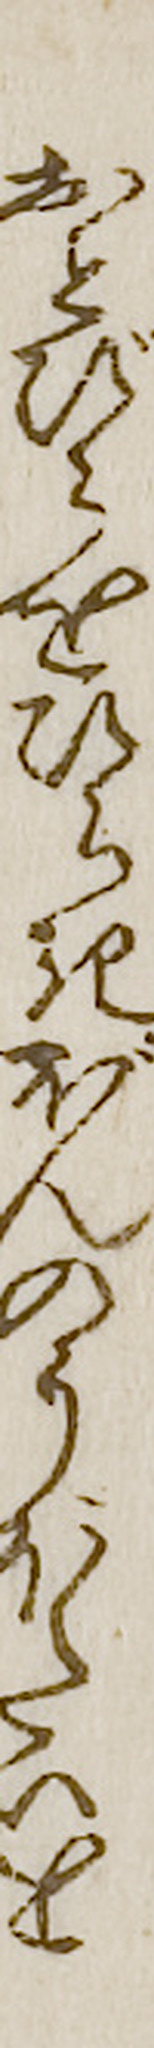おとびらをひらきぼんのうぼたいを
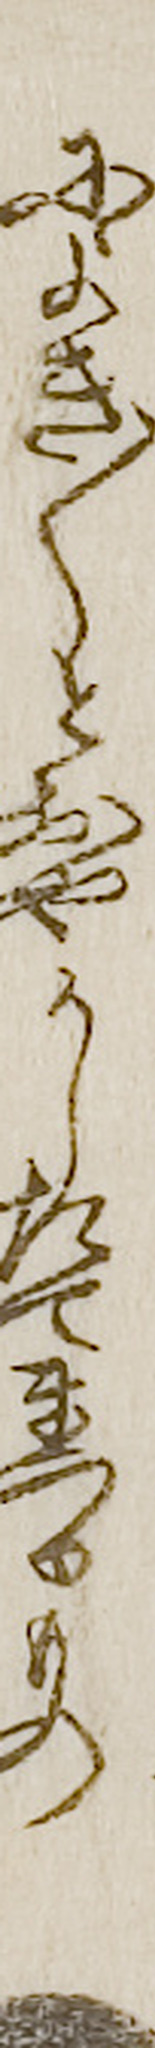によき〳〵と出やうしたてまつるもの
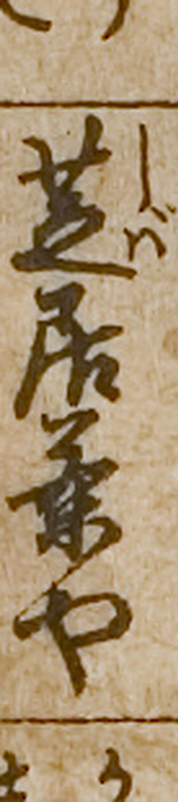芝居茶や
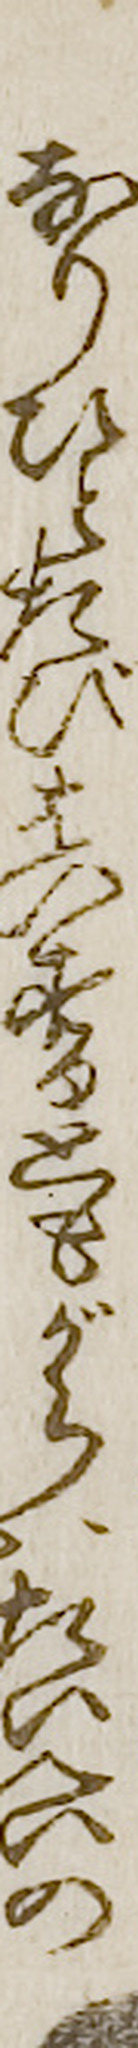なりひとたびはいするともがらはたいへいの
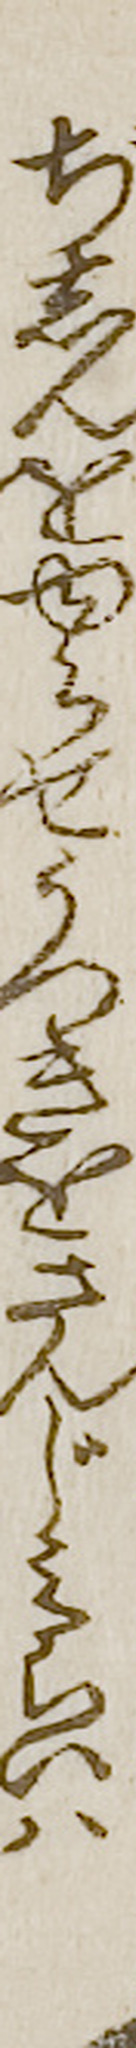ぢしんをゆらせうつきをさんじみらいは
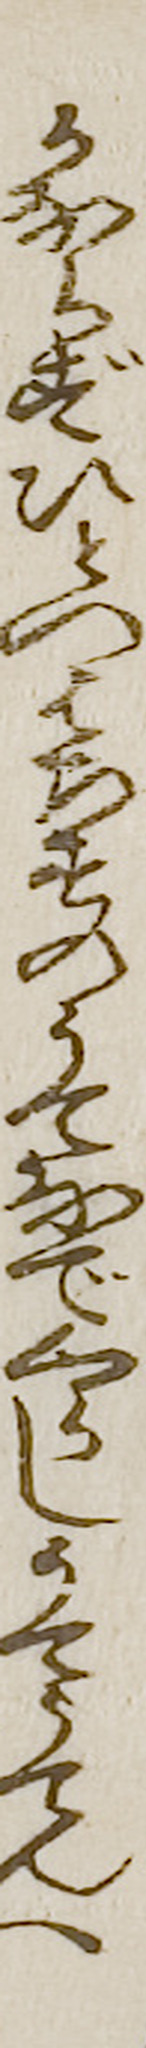かならずひとつはちすのうてなでくらしうてうてんへ
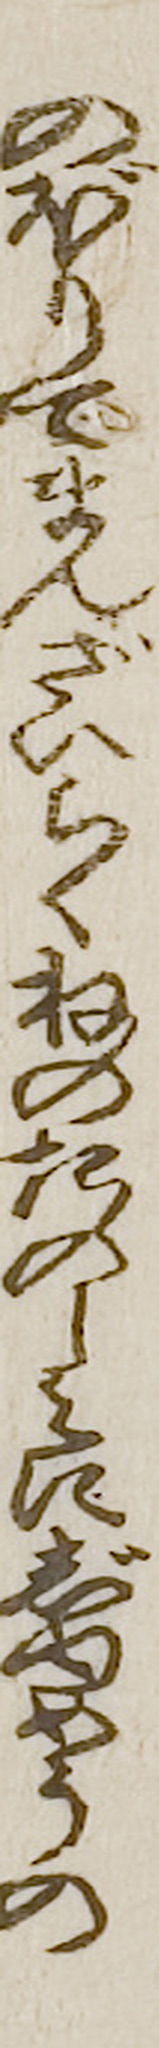のぼりてまんざいらくねのたのしみにじゆめうの
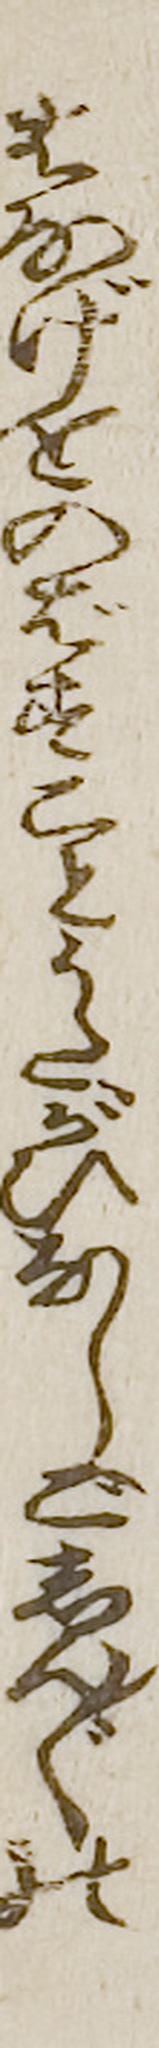はなげをのばすことうたがひなしごしん〴〵の
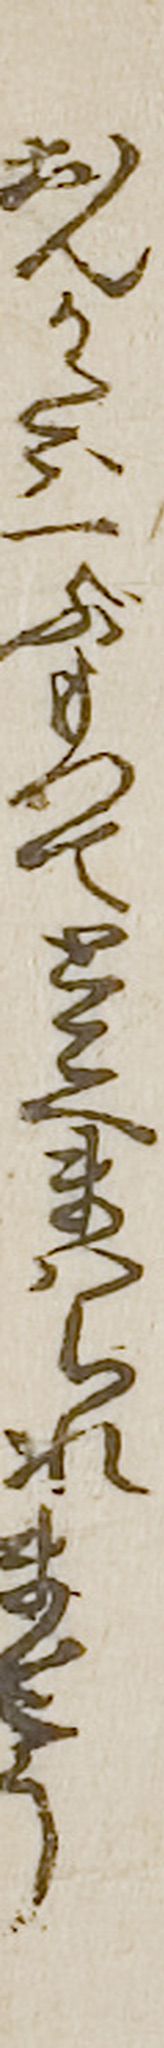おんかたは一ぶもつてとこへまいられませう
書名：泪如来の損像 山の宿聖天町ニて有頂天五十日の間開帳
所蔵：東京大学総合図書館 General Library in the University of Tokyo, JAPAN
